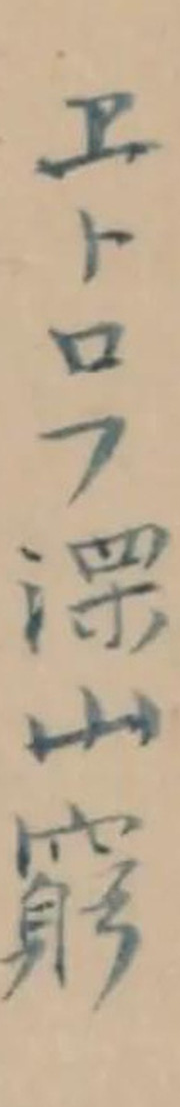ヱトロフ深山窮
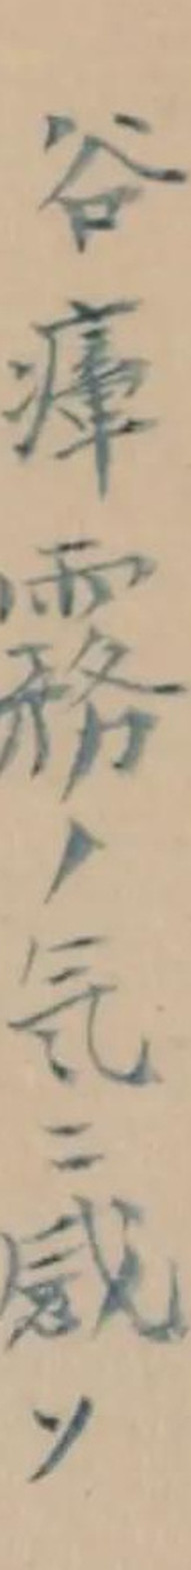谷瘴霧ノ気ニ感シテ
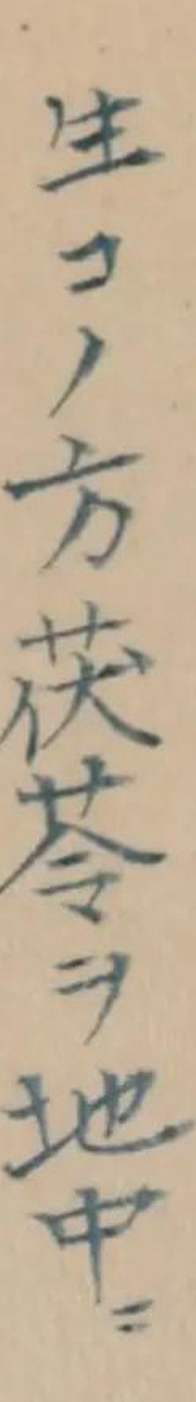生コノ方茯苓ヲ地中
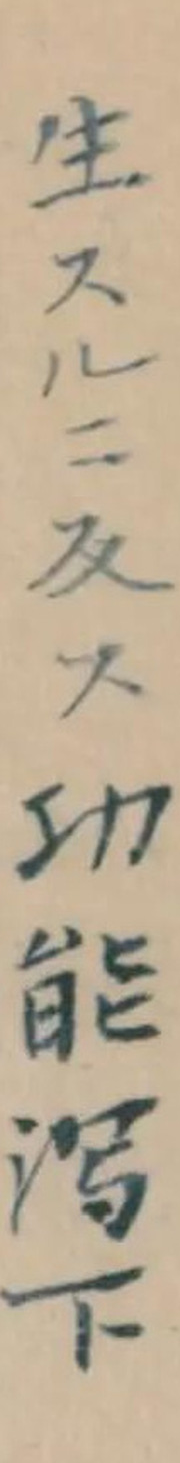生スルニ反ス功能瀉下
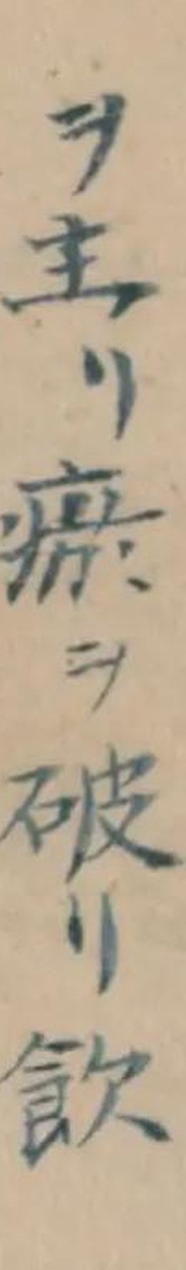ヲ主リ瘀ヲ破リ飲
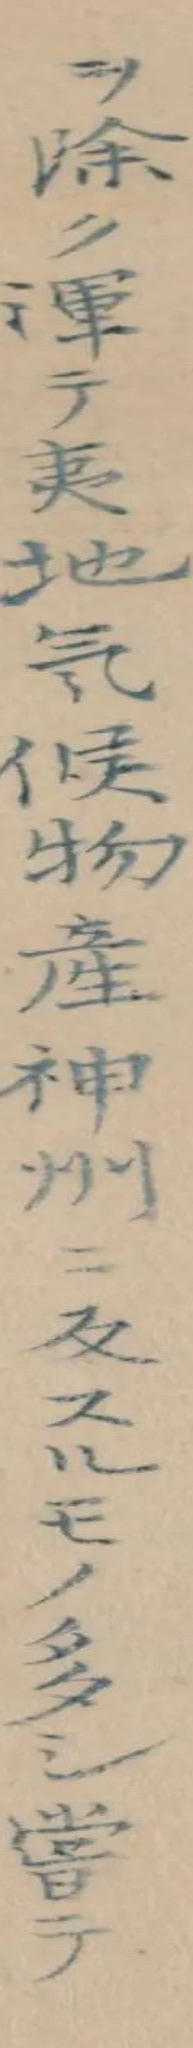ヲ除ク渾テ夷地気候物産神州ニ反スルモノ多シ嘗テ
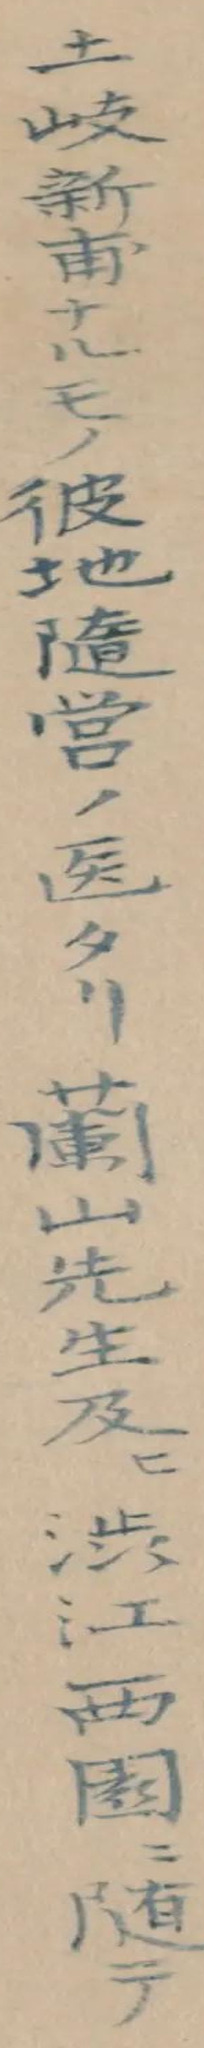土岐新甫ナルモノ彼地随営ノ医タリ蘭山先生及渋江西園随テ
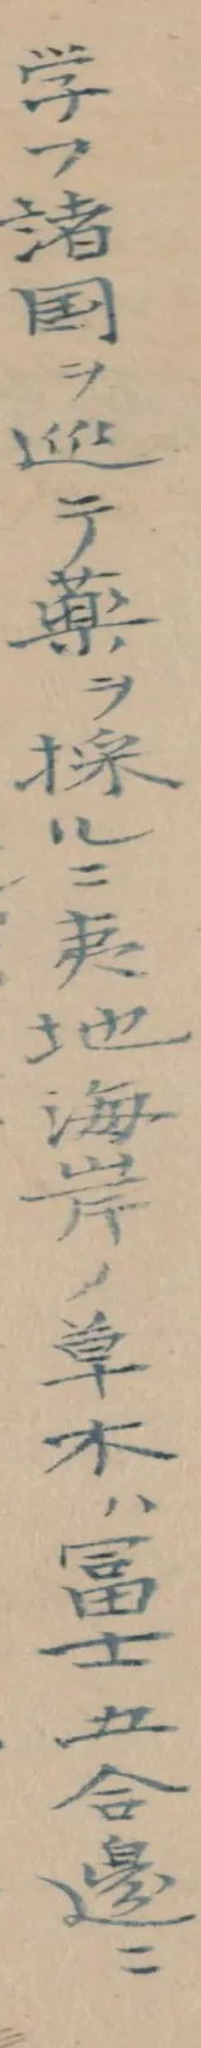学フ諸国ヲ巡テ薬ヲ採ルニ夷地海岸ノ草木ハ富士五合辺ニ
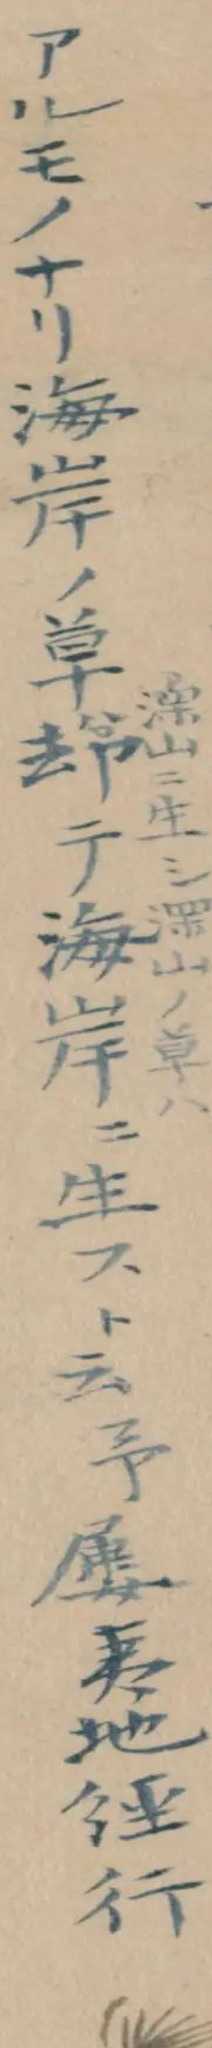アルモノナリ海岸ノ草○却テ海岸生スト云予屡夷地径行
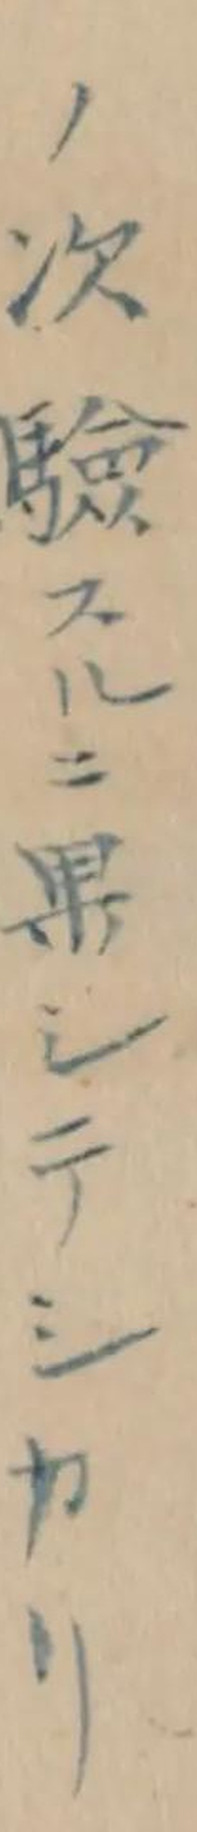ノ次験スルニ果シテシカリ

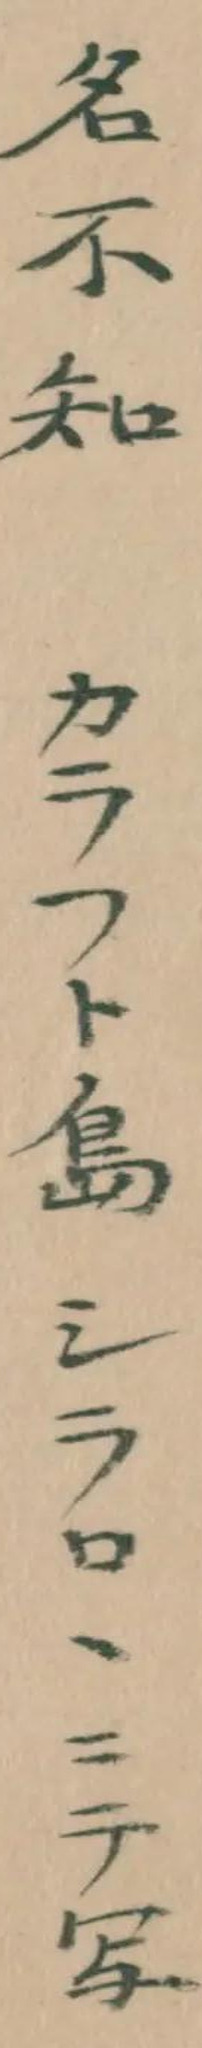名不知カラフト島シラロヽニテ写
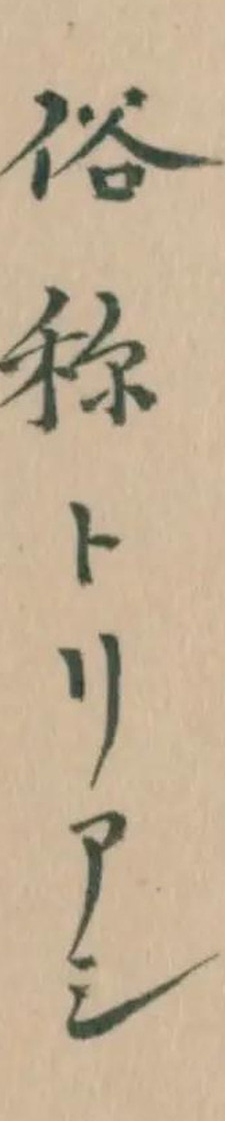俗称トリアシ
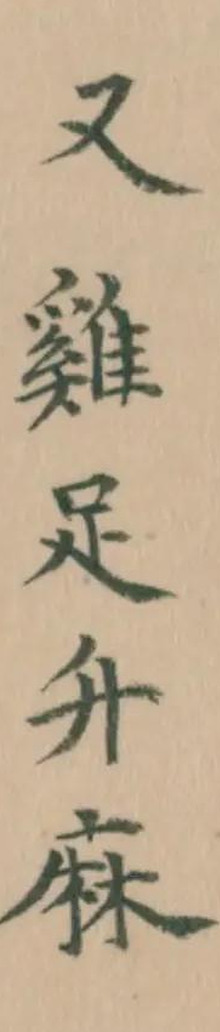又鶏足升麻
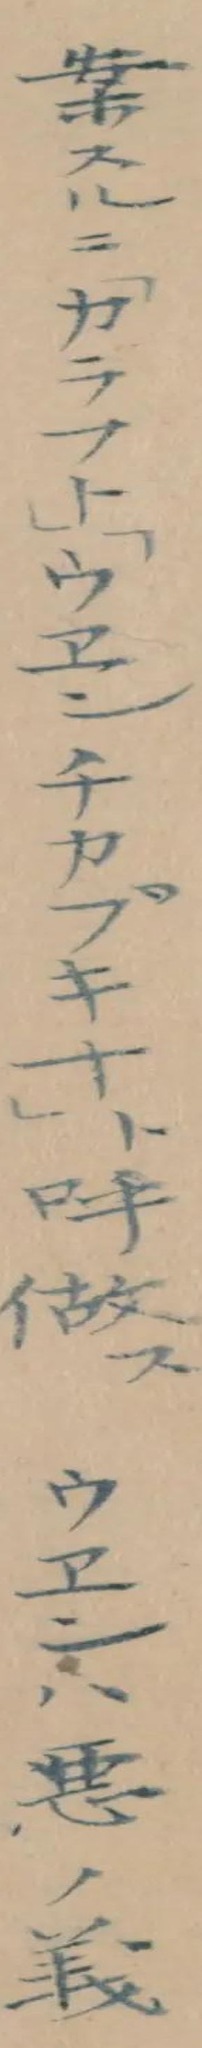案スルニ「カラフト」「ウヱンチカププキナ」ト呼做スウヱンハ悪ノ義
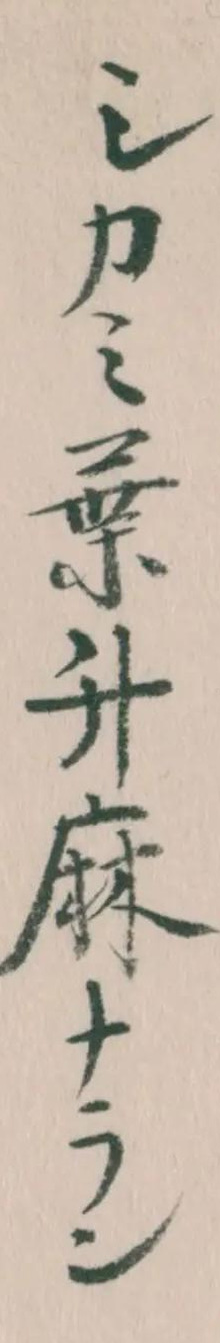シカミ葉升麻ナラン

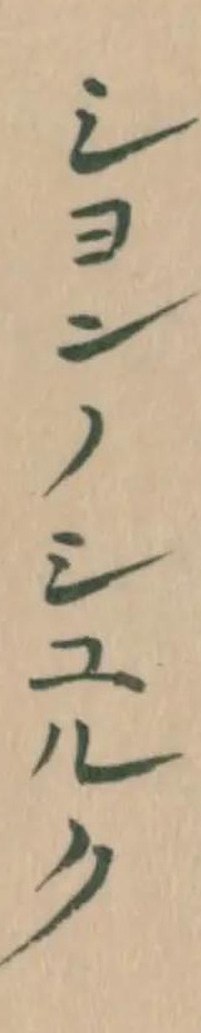シヨンノシユルク
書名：蝦夷草木図
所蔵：国立国会図書館 National Diet Library, JAPAN
